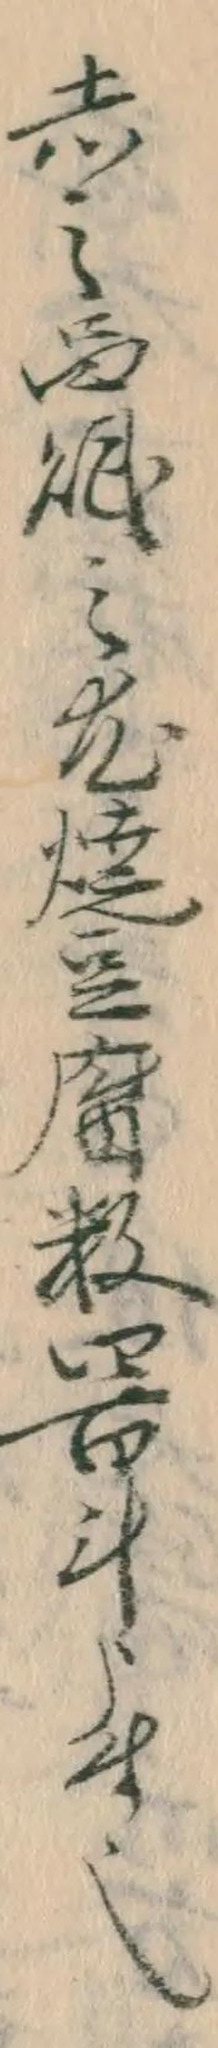志之品賦之尤焼豆腐数四百斗申付也
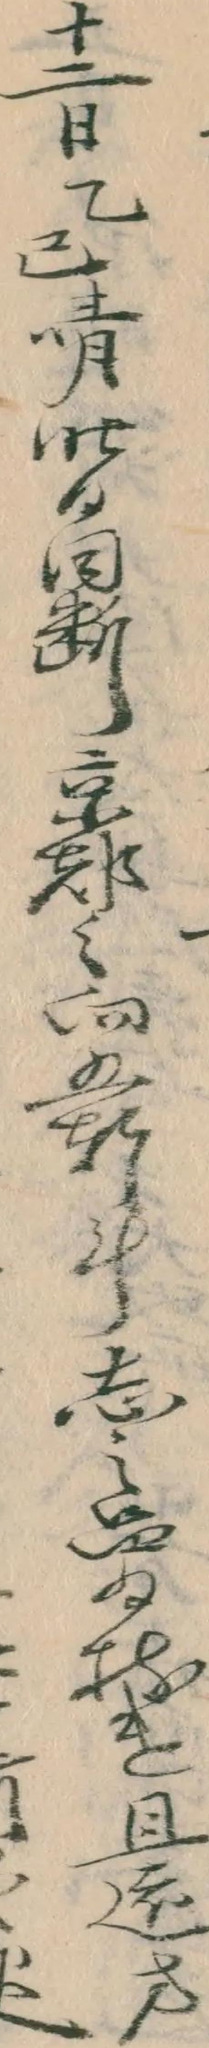十二日乙巳晴昨日同断京都之向五軒斗志之品為持遣且遠方
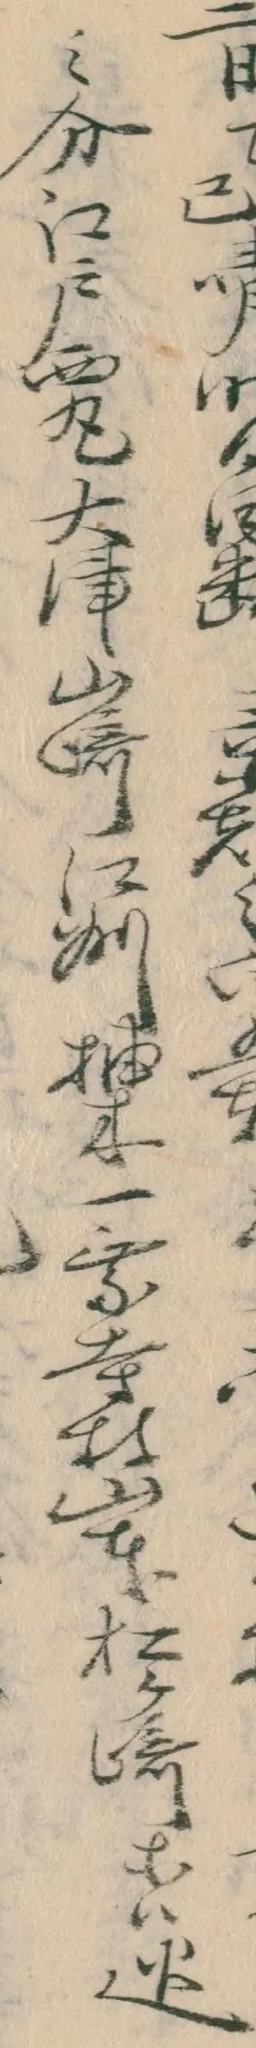之分江戸西丸大津山崎江州柚木一乗寺村山本松ヶ崎等ハ過
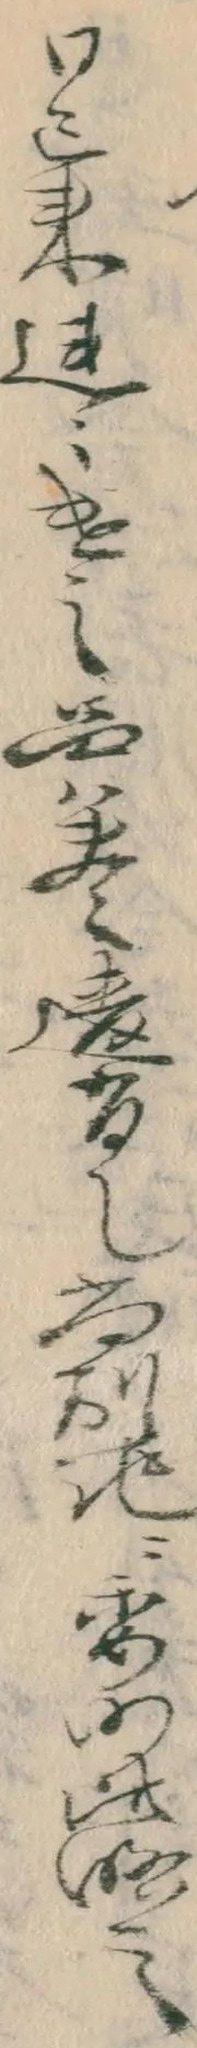日已来連々遣し品ハ夫々違有之尚別記ニ委し仍此略之
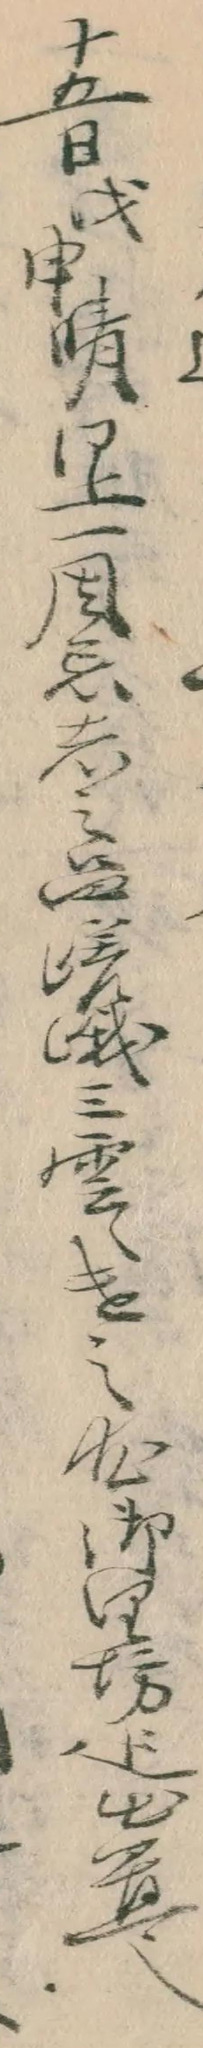十五日戊申晴同上一周忌右之品嵯峨三雲へ遣之尤御里坊迄出置也
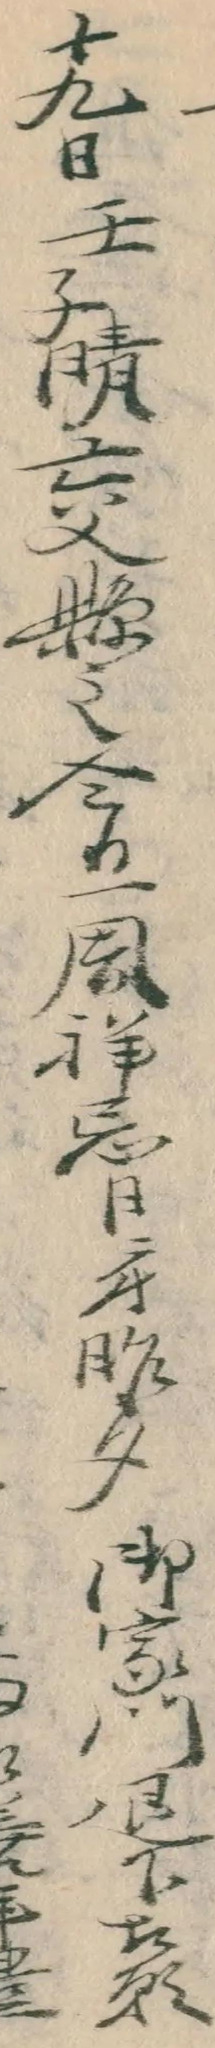十九日壬子晴亡父縣主今日一周祥忌日ニ付昨夕御家門退下相頼
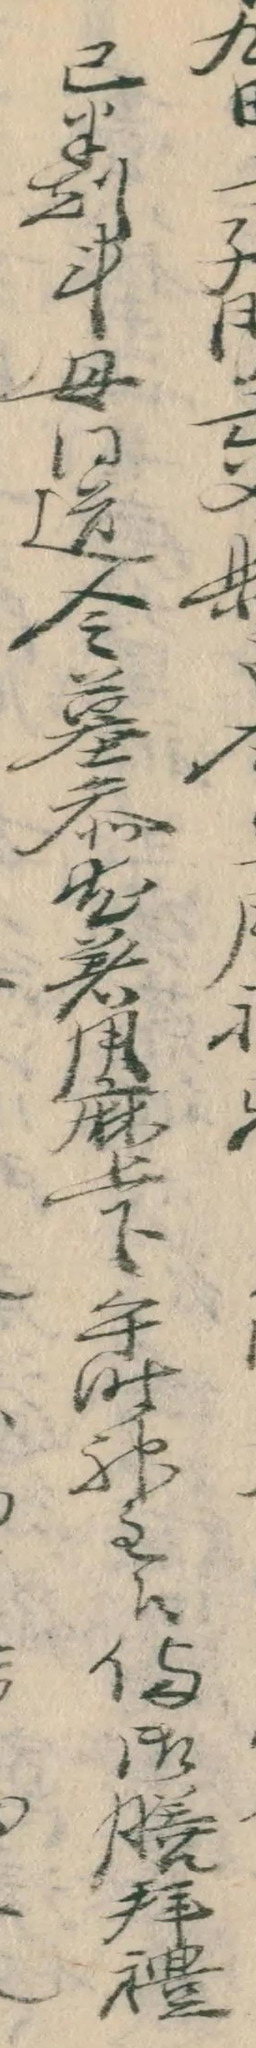巳半刻斗母同道令墓所参尤着用麻上下午時神主え侍御膳拝禮
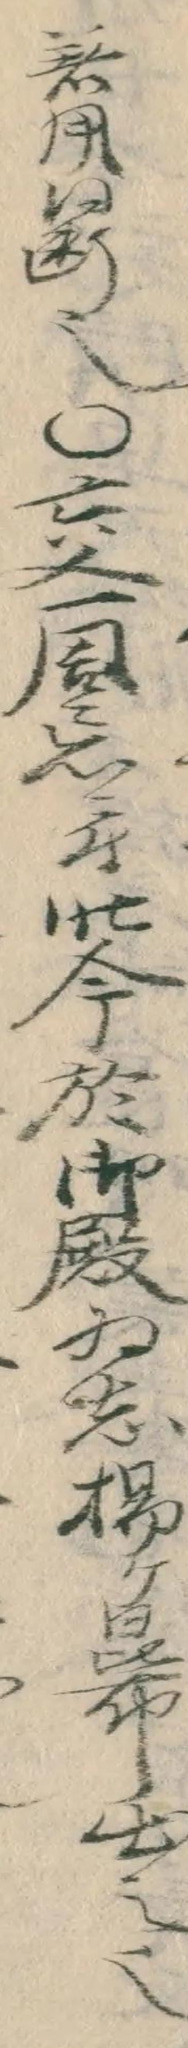着用同断也○亡父一周忌ニ付此今於御殿為志揚ケ昆布出之也
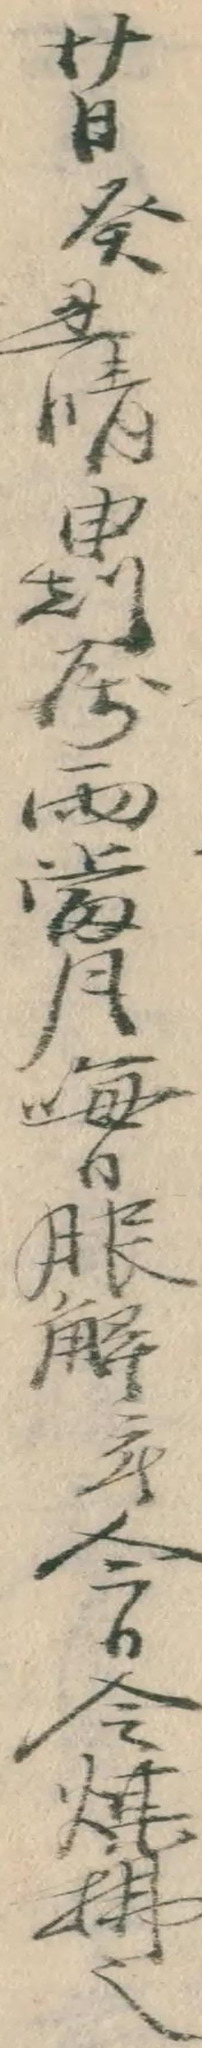廿日癸丑晴申刻属雨當月晦日服解ニ付今日令煤払也
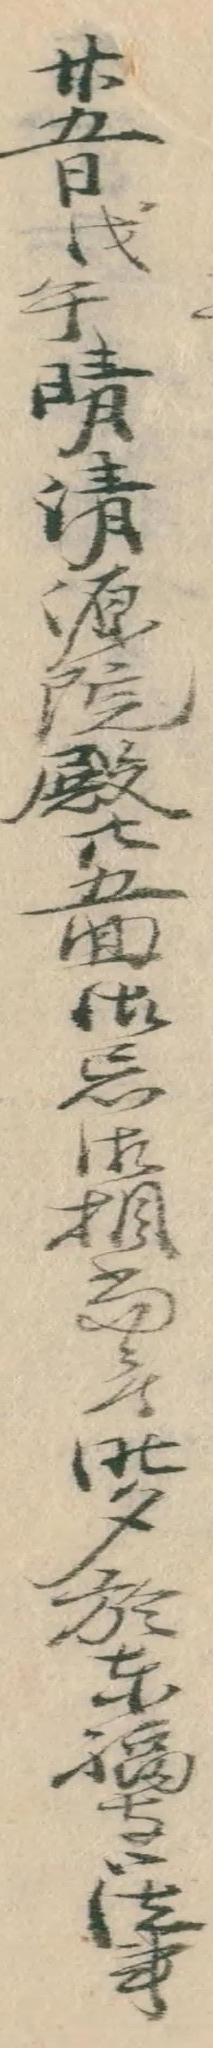廿五日戊午晴清源院殿廿五回御忌相當ニ付昨夕於東福寺御法事
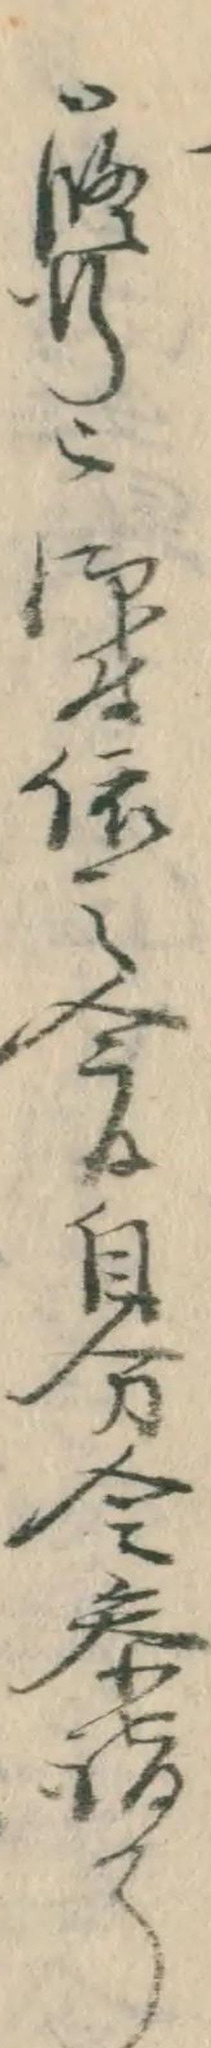御修行被仰付依之今日自分令参詣了
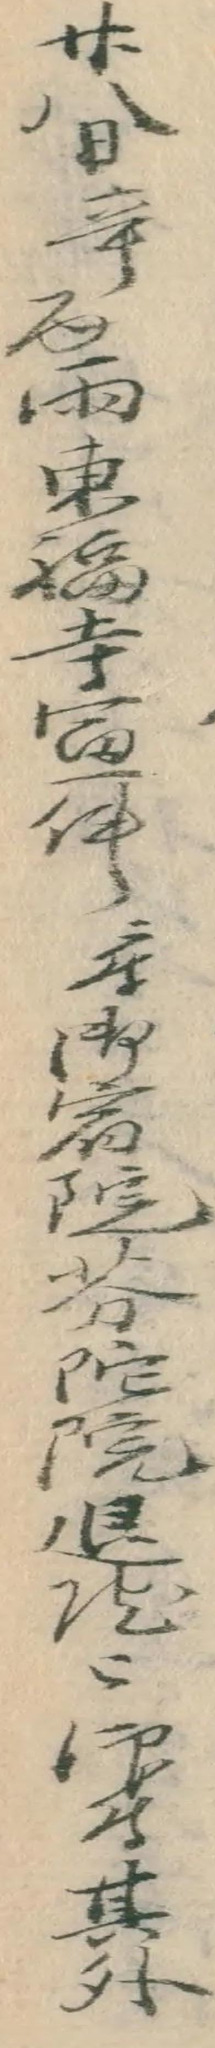廿八日辛酉雨東福寺冨一件ニ付御宿院芩陀院退院被仰付其外

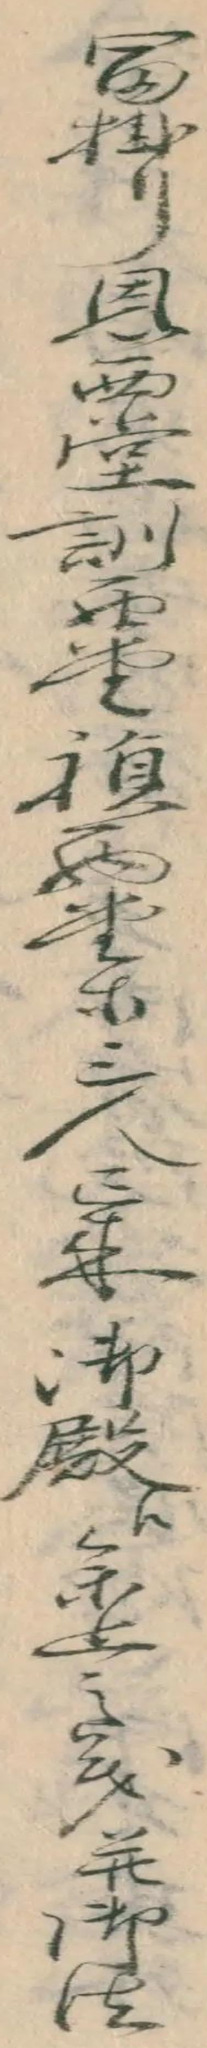冨掛リ恩西堂訓西堂禎西堂等三人已来御殿え参上之義并御法
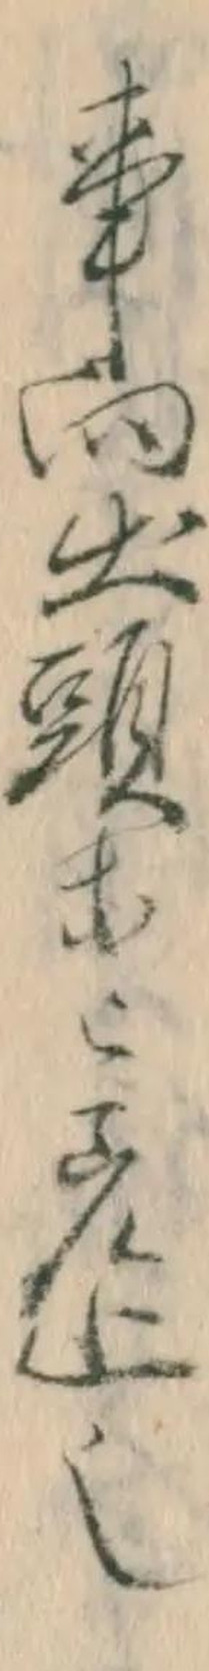事尚出頭等被差上也
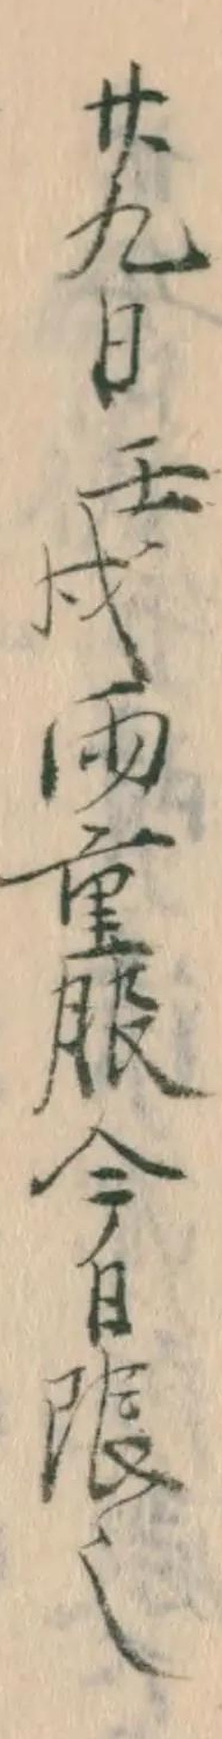廿九日壬戌雨重服今日限也
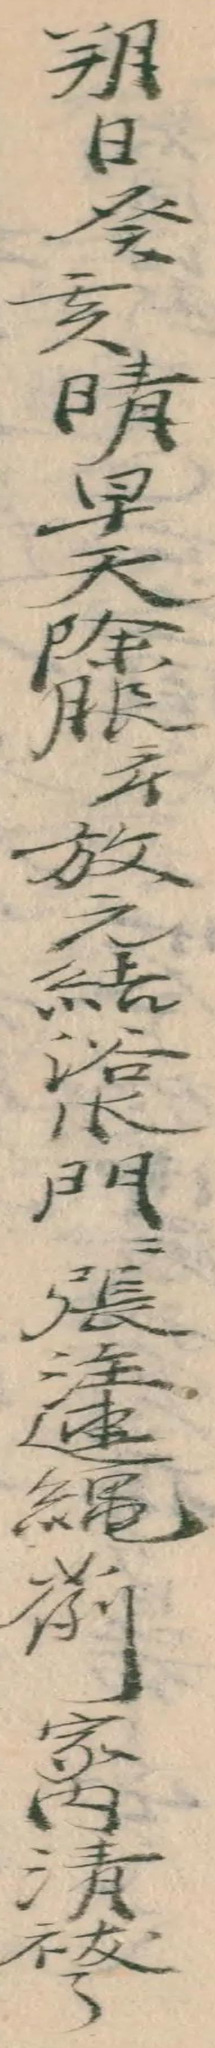朔日癸亥晴早天除服ニ付放元結浴水門に張注連縄如例家内清祓了
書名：賀茂社記録. 第65冊
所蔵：国立国会図書館 National Diet Library, JAPAN
